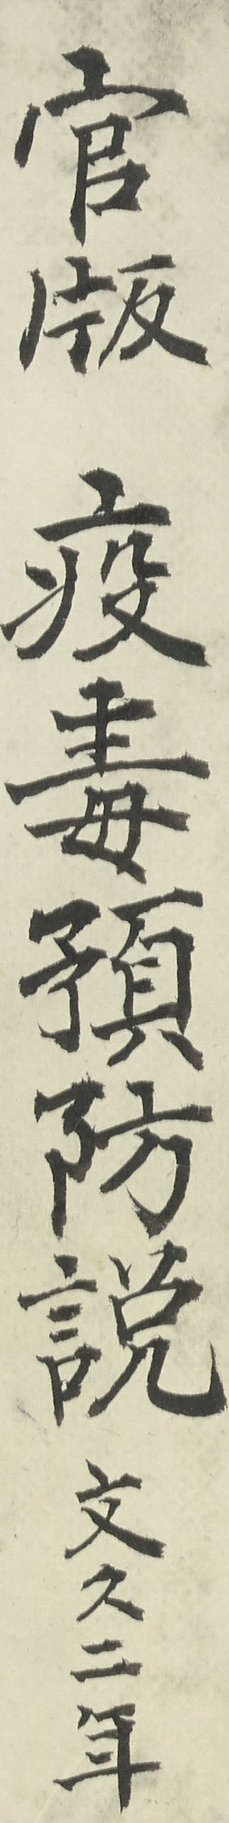官版疫毒預防説文久二年

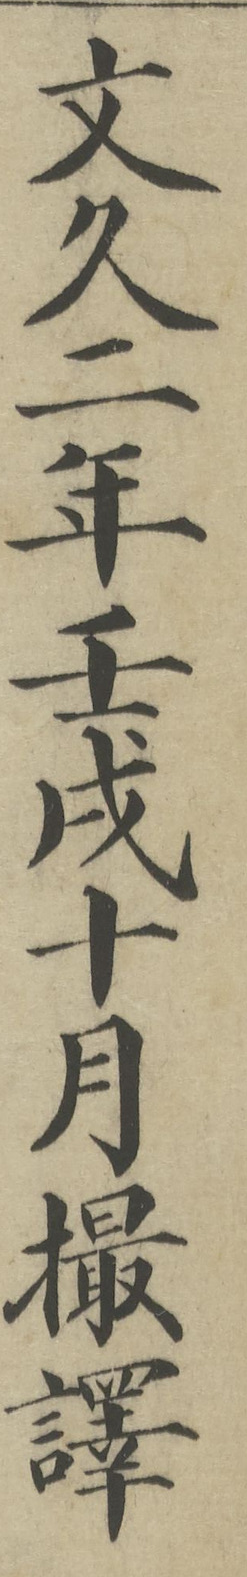文久二年壬戌十月撮譯
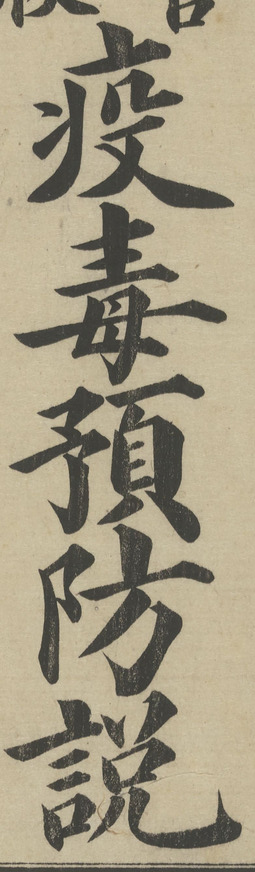疫毒預防説
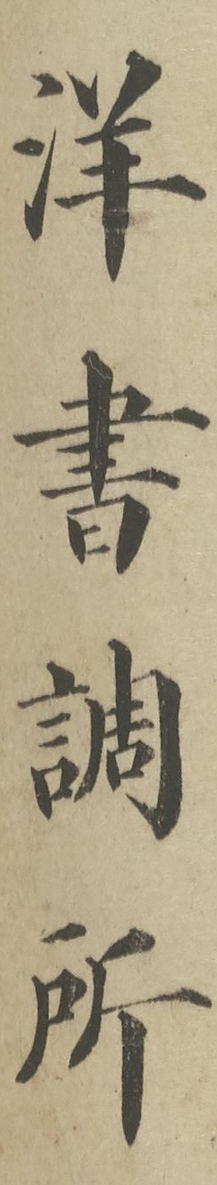洋書調所
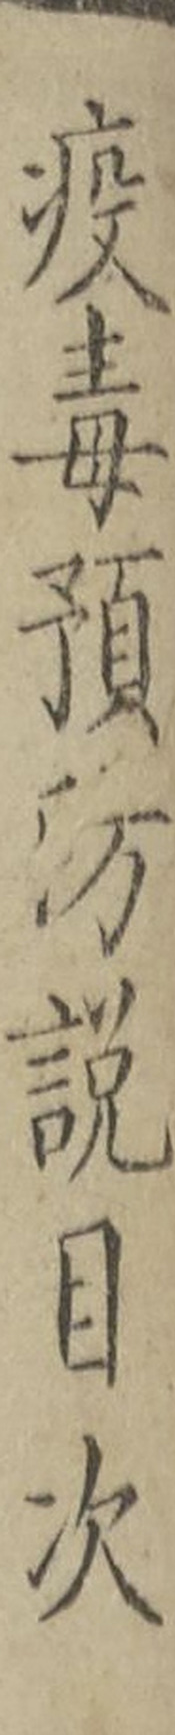疫毒預防説目次
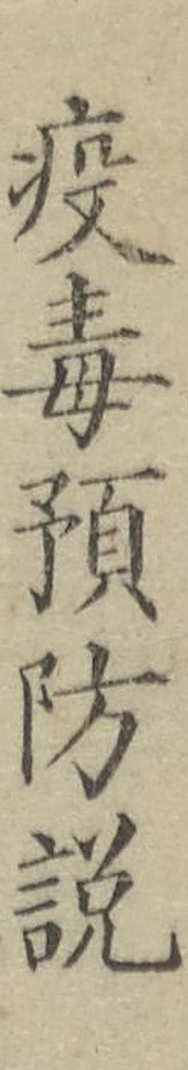疫毒預防説
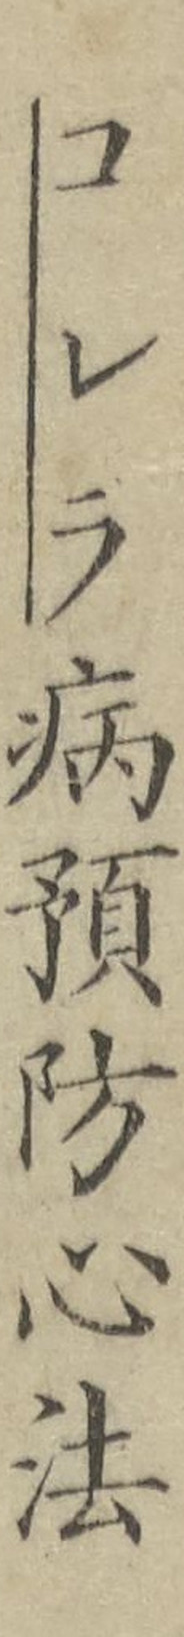コレラ病預防心法
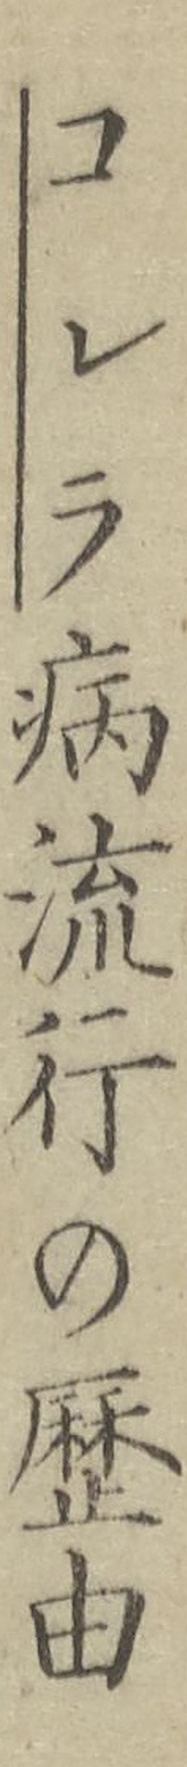コレラ病流行の歴由
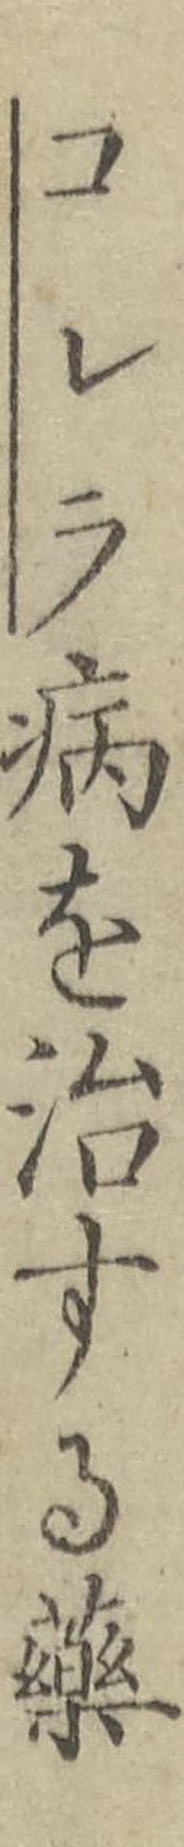コレラ病を治する藥
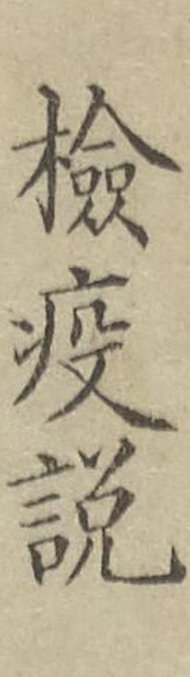検疫説
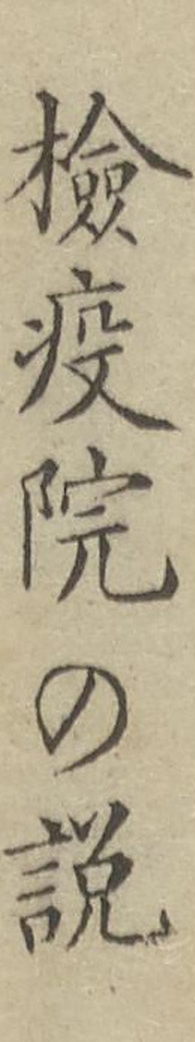検疫院の説

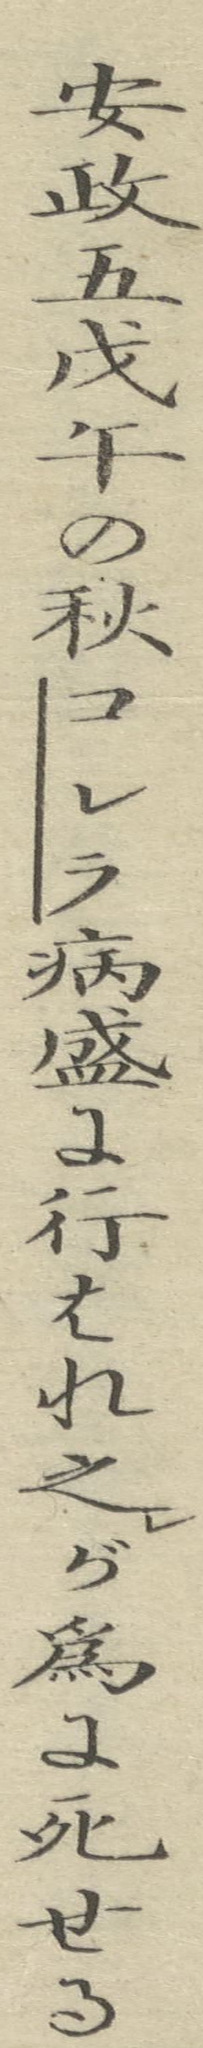一安政五戌午の秋コレラ病盛に行はれ之為に死せる
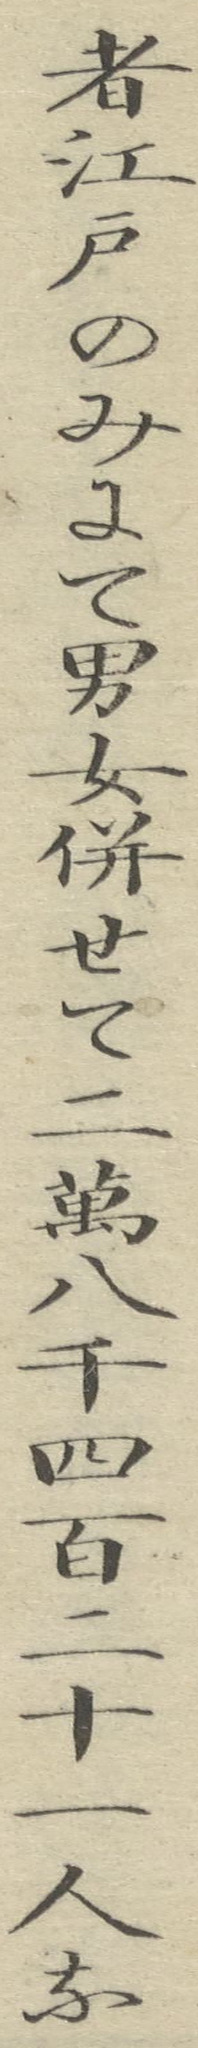者江戸のみにて男女併せて二萬八千四百二十一人な
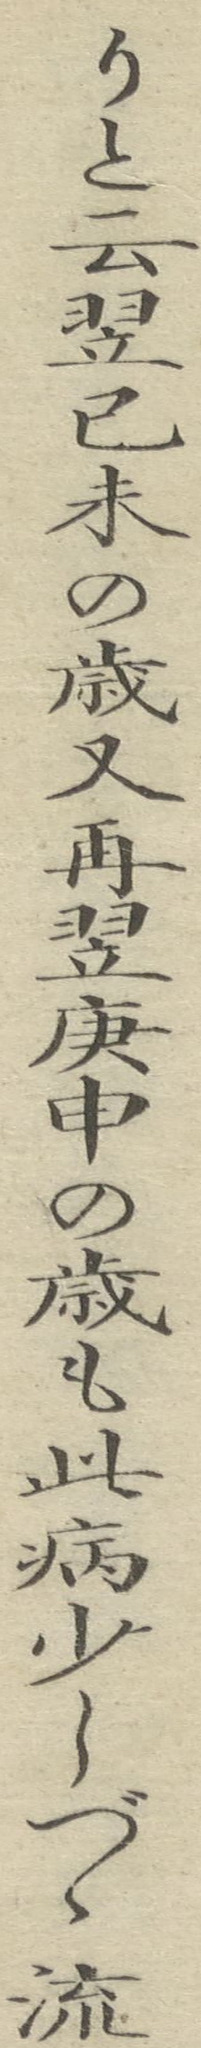ろと云翌巳未の歳又再翌庚申の歳も此病少しづゝ流
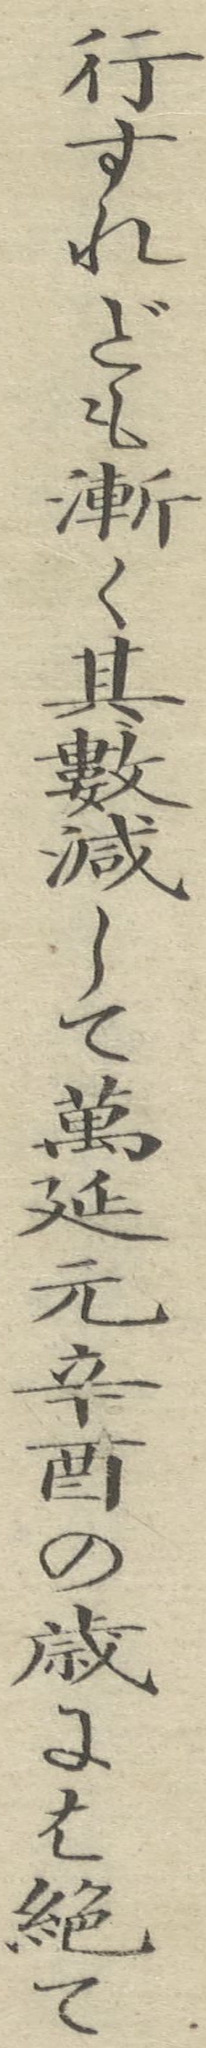行すれども漸く其數減して萬延元辛酉の歳には絶て
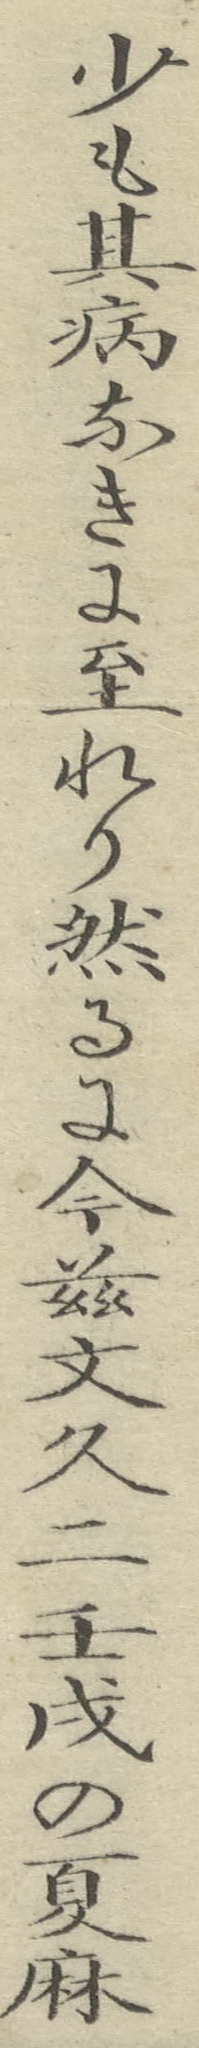少も其病なきに至れり然るに今茲文久二年壬戌の夏麻
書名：官版疫毒預防説　全
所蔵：東京大学総合図書館 General Library in the University of Tokyo, JAPAN
